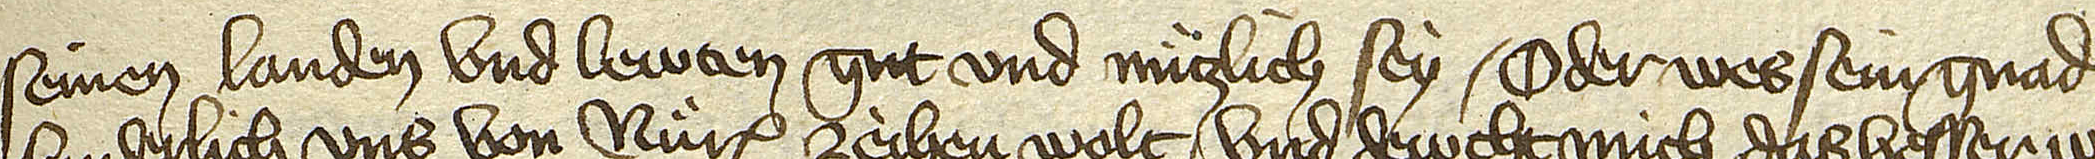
ſeinen landen vnd lewten gut vnd nücʒlich ſey / Oder wes ſein gnad
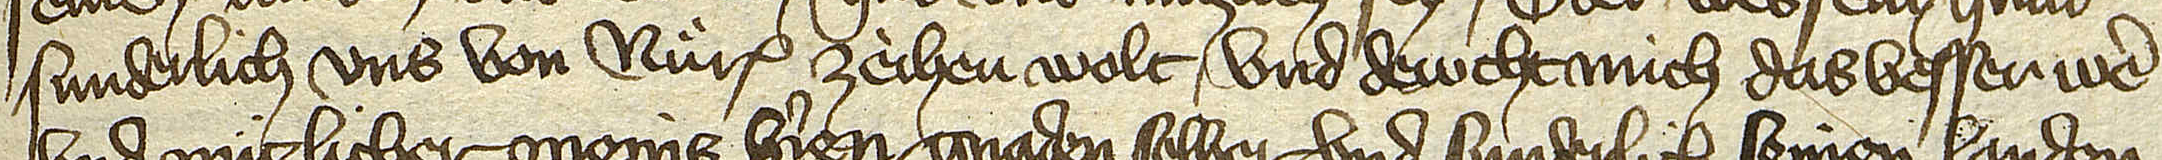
ſunderlich vns von Nür* cʒeihen wolt / vnd dewcht mich das beſſer we*
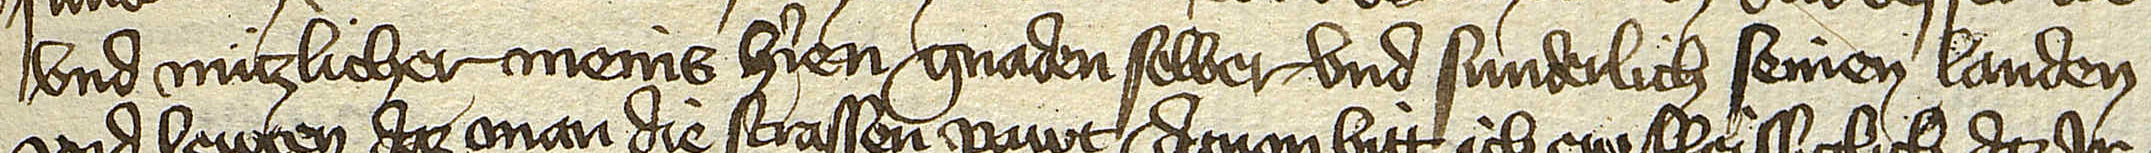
vnd nücʒlicher meins h*ren gnaden ſelber / vnd ſunderlich ſeinen landen
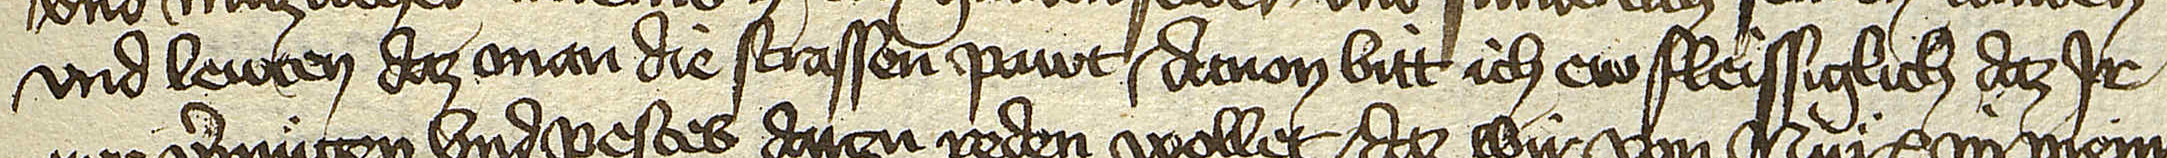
vnd lewten daʒ man die ſtraſſen pawt / dauon bitt ich ew fleiſſiglich daʒ Ir
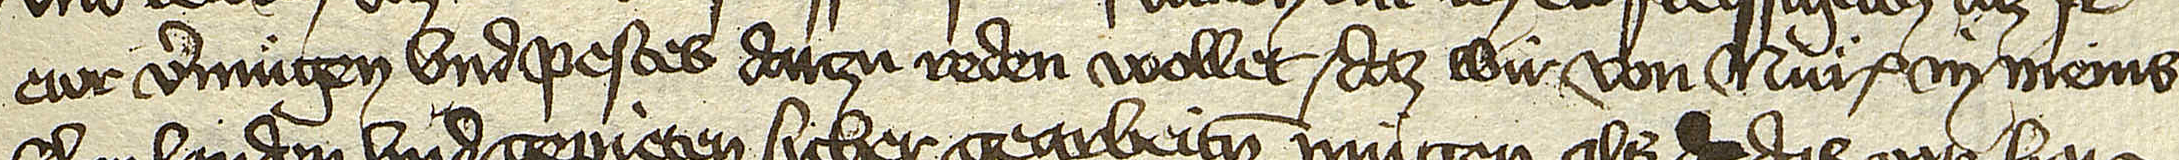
ewr v*mügen vnd peſtes darcʒu reden wollet / daʒ wir von Nür* in meins
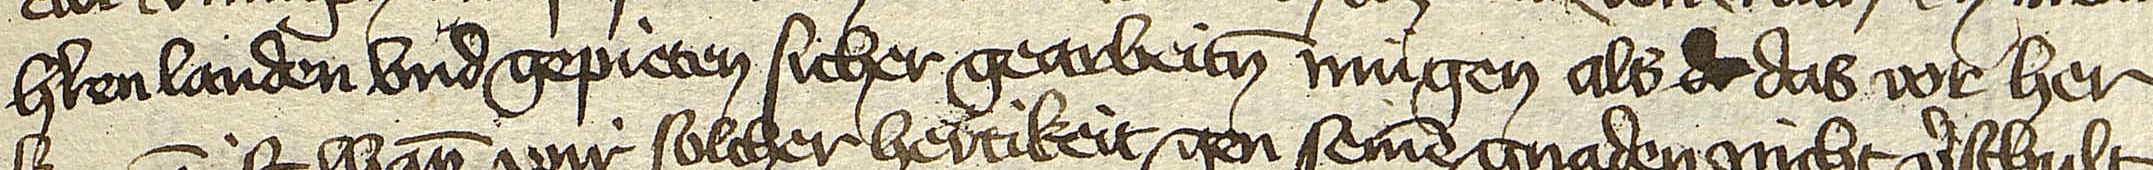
h*ren landen vnd gepieten ſicher gearbeitn* mügen als d das vor her
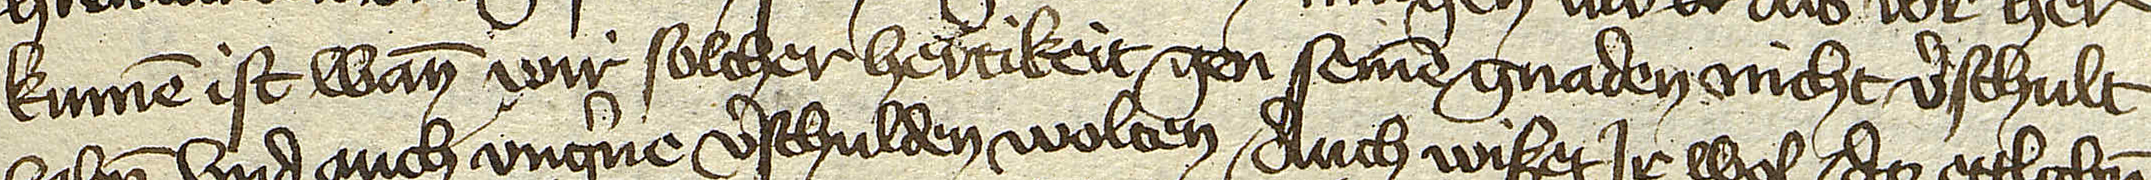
kume* iſt wan* wir ſolcher hertkeit gen ſeine* gnaden nicht v*ſchult
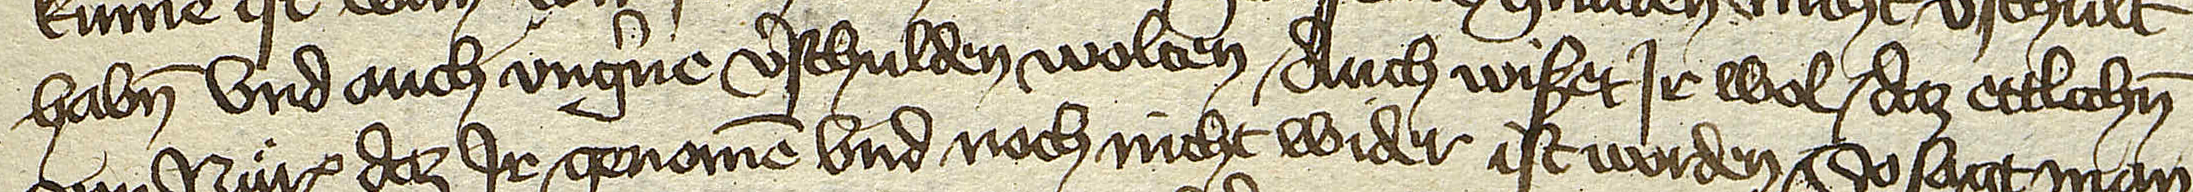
habn* vnd auch vng*ne v*ſchulden wolten / Auch wiſʒet Ir wol / daʒ ettlichn*
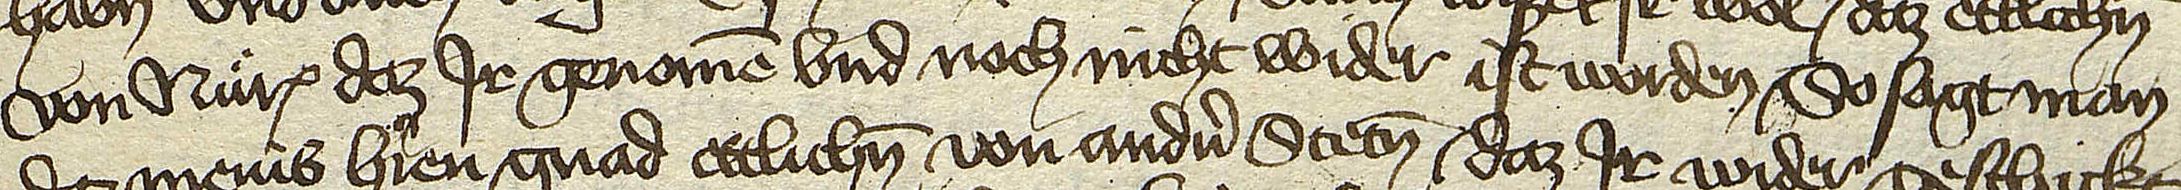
von Nür* daʒ Ir genome* vnd noch nicht wider iſt worden / So ſagt man
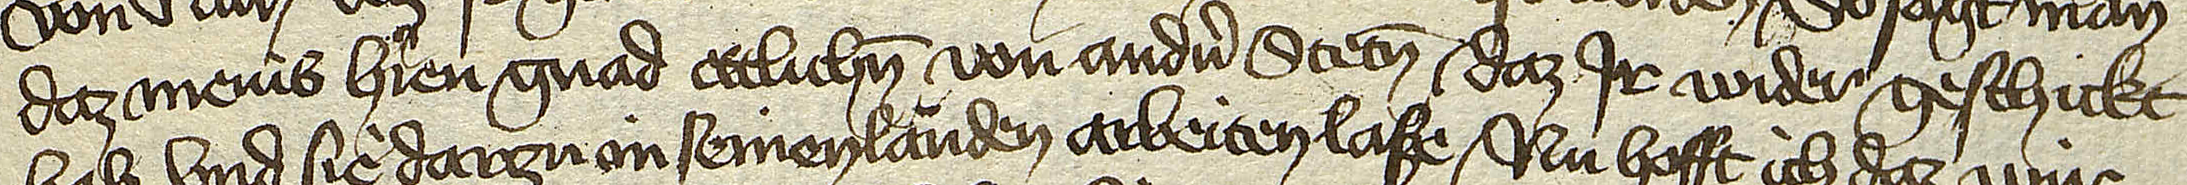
daʒ meins h*ren gnad ettlichn* von andn* Stetn* / daʒ Ir wider geſchickt
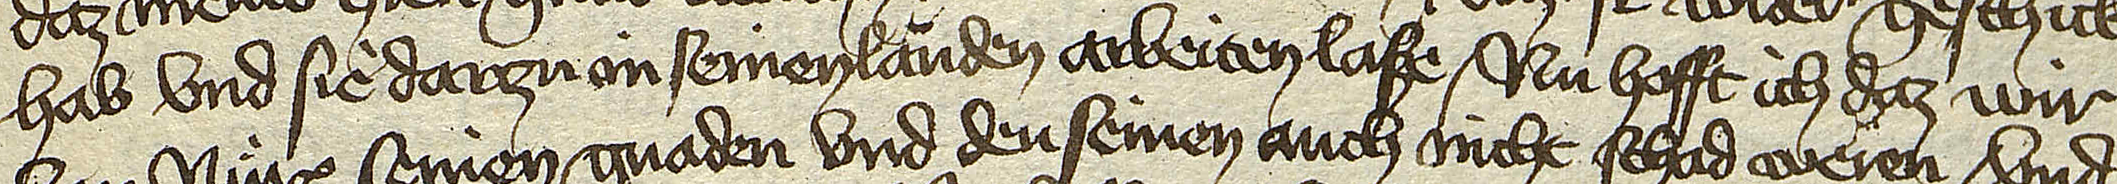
hab vnd ſie darcʒu in ſeinen landen arbeiten laſʒe / Nu hofft ich daʒ wir
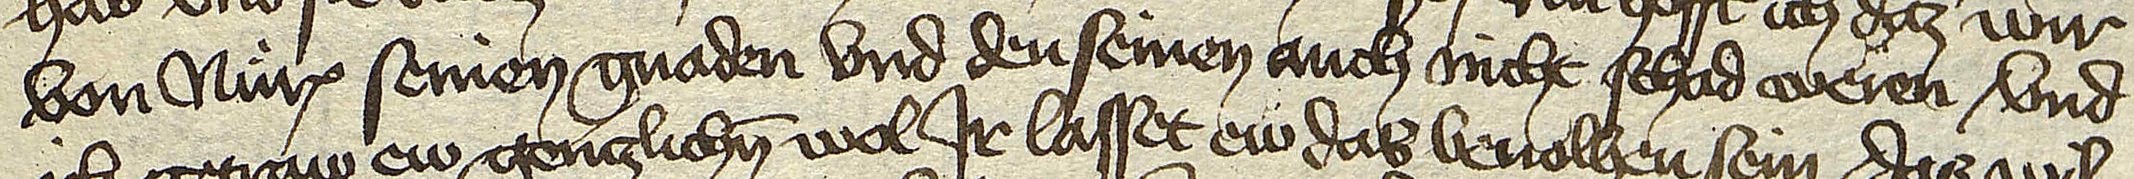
von Nür* ſeinen gnaden vnd den ſeinen auch nicht ſchad weren / vnd
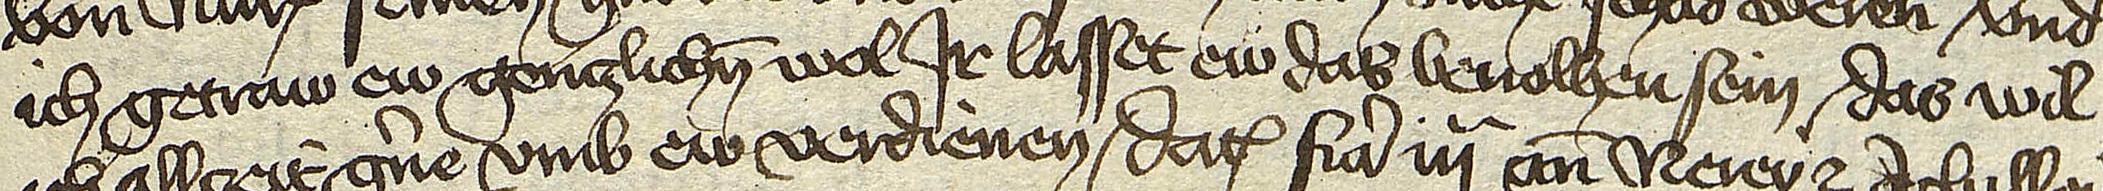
ich getraw ew gencʒlichn* wol Ir laſſet ew das beuolhen ſein / das wil
